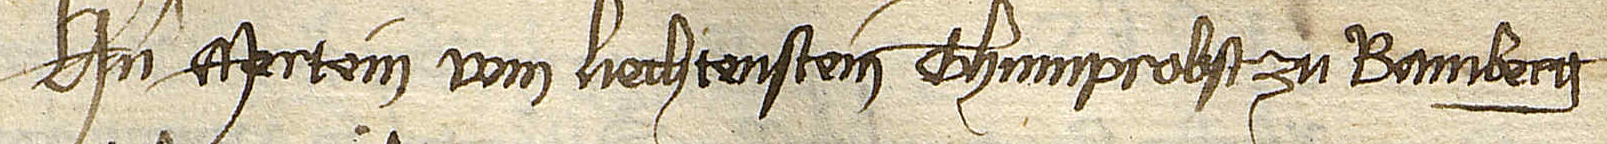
Hn* Mertein vom liechtenſtein* Thumprobſt ʒu Bamberg
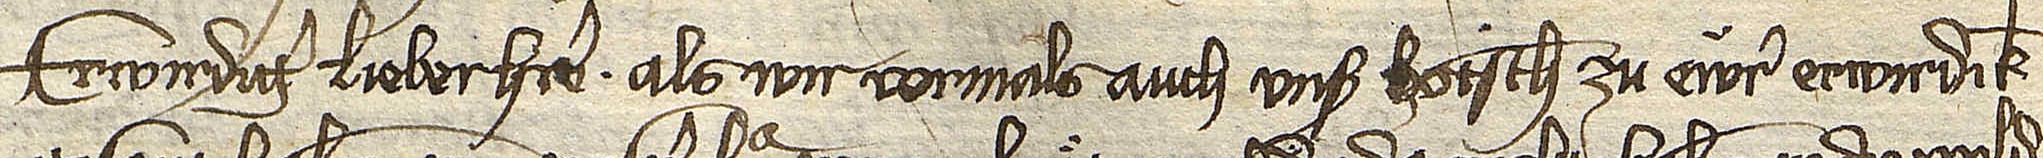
Erwirdig* lieber h*re . als wir vormals auch vnſ* botſch* ʒu eẅr* erwirdik*
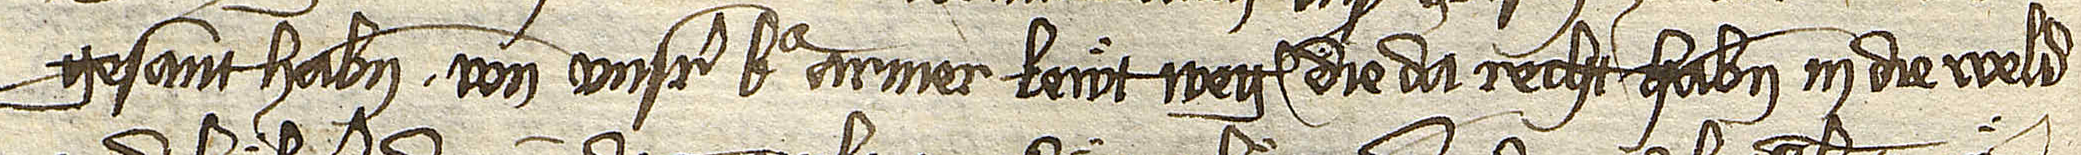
geſant habn* . von vnſr* b* armer leẅt weg* die da recht habn* in die weld
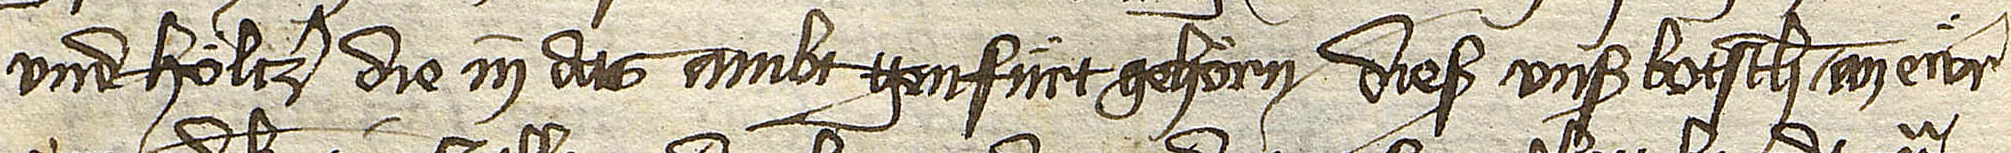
vnd hölcʒ* die in das ambt gen fürt gehörn / Dieſ* vnſ* botſch* / an eẅr*
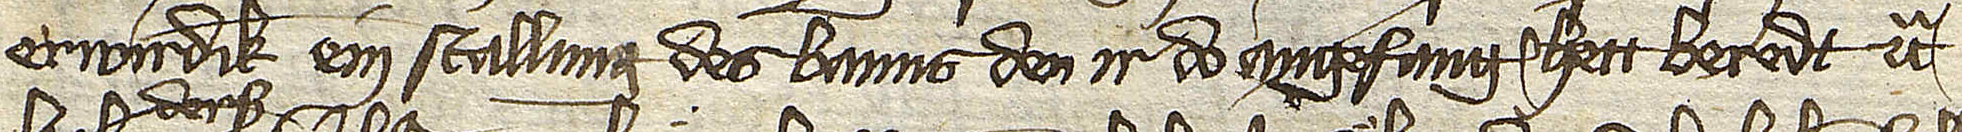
erwirdik* ein ſtallung Des hanns den ir do angefang* hett beredt ec*
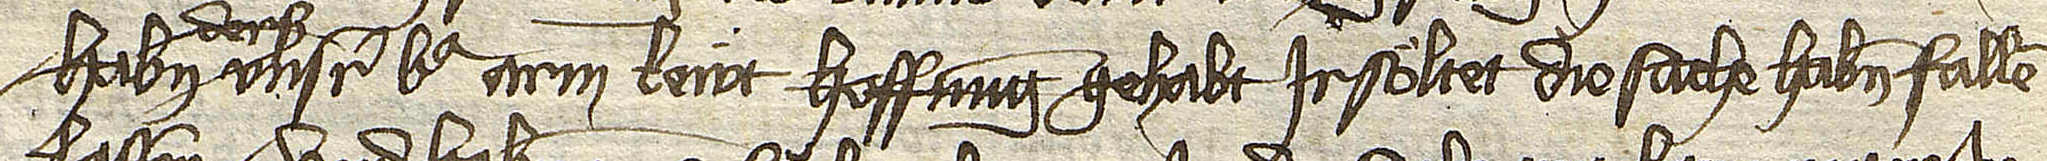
habn* vnſr* b* arm leẅt hoffnu*g gehabt Ir ſöltet die ſache habn* falle*
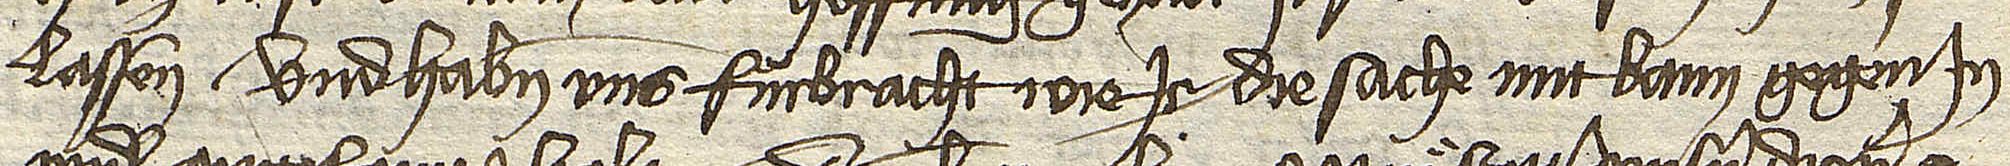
laſſen / Vnd habn* vns fürbracht wie Ir die ſache mit bann gegen In
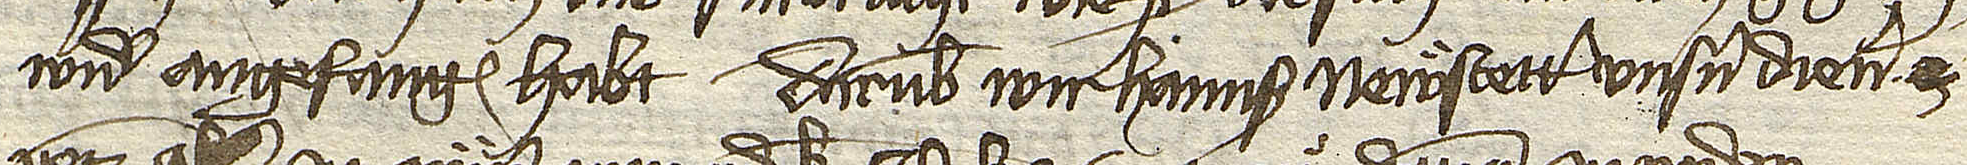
wid* angefang* habt / Darüb* wir hannſ* Neẅſtett* vnſn* dien* ʒ
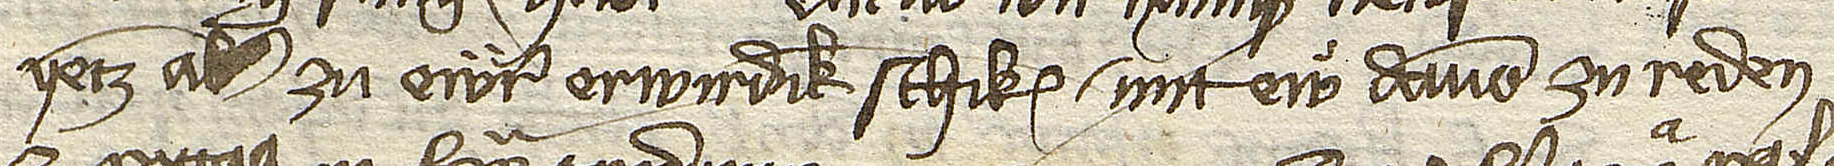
yecʒ* ab* ʒu eẅr* erwidrik* ſchik* / mit eẅ daruo* ʒu reden
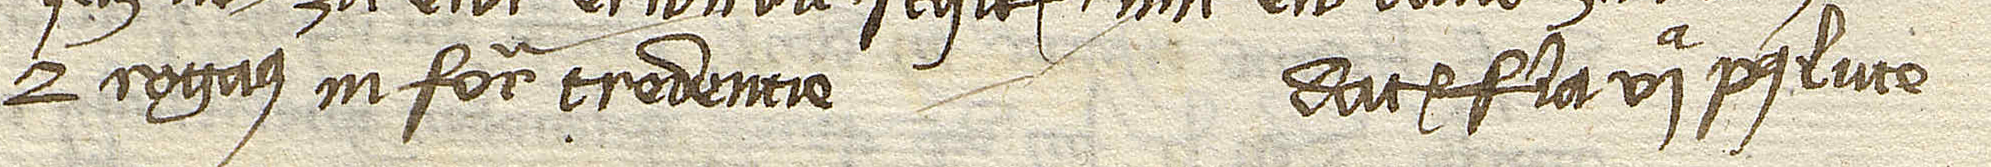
@ roga* in for* credencie Dat* fi*a vi* p* luce
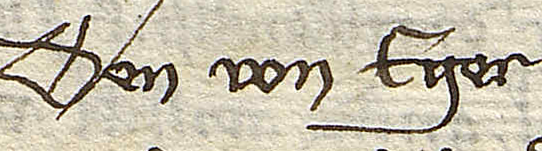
Den von Eger
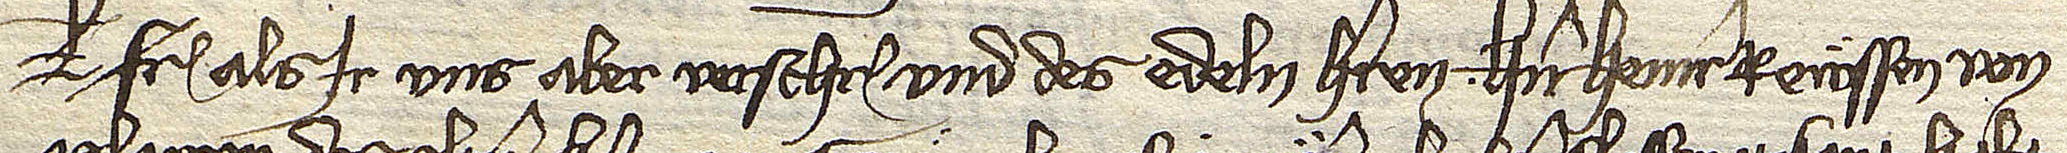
L* fr* als Ir vns aber verſchr* vnd des edeln h*ren . Hr* Heinr* Reẅſſen von
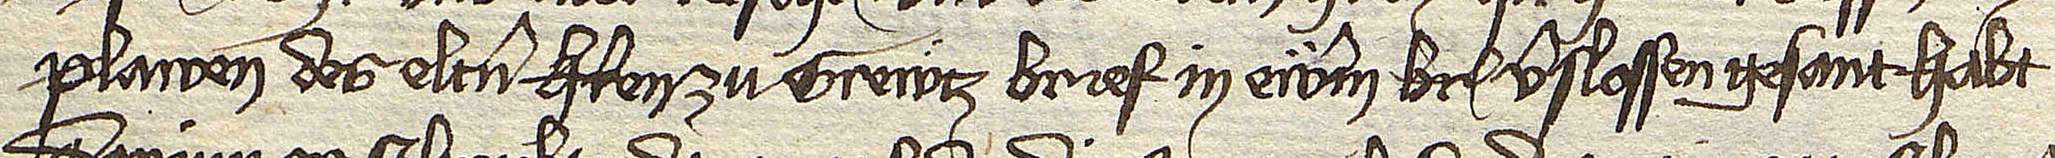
Plawen des eltn* h*ren ʒu Greẅcʒ brief in eẅ*m br* v*ſloſſen geſant habt
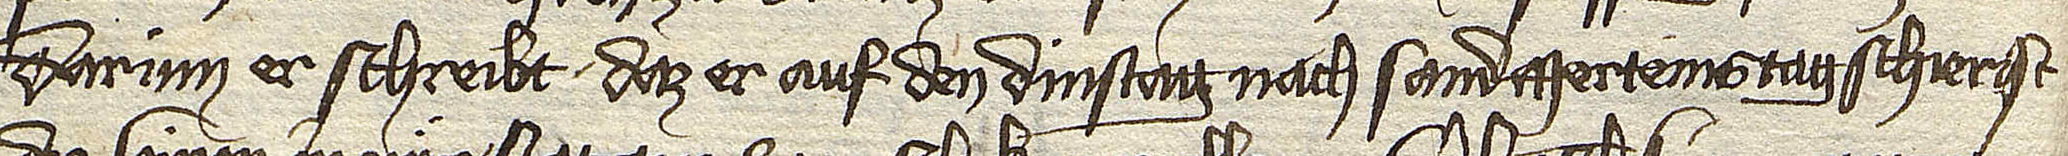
Darinn er ſchreibt / daʒ er auf den dinſtag nach ſand Merteinstag ſchieriſt
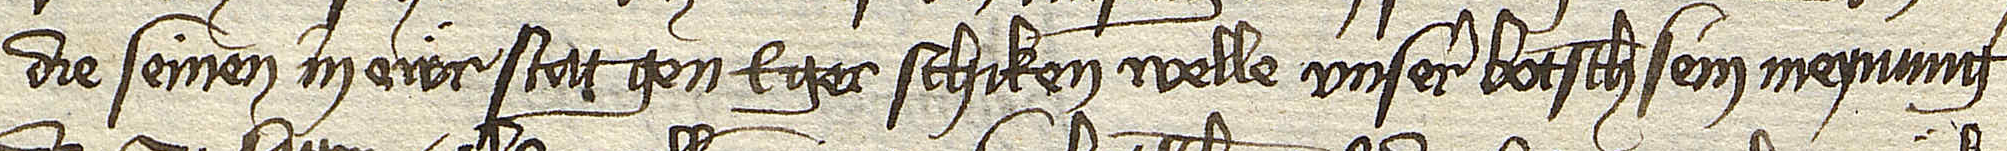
die ſeinen in eẅr ſtat gen Eger ſchiken welle vnſer* botſch* ſein meynung
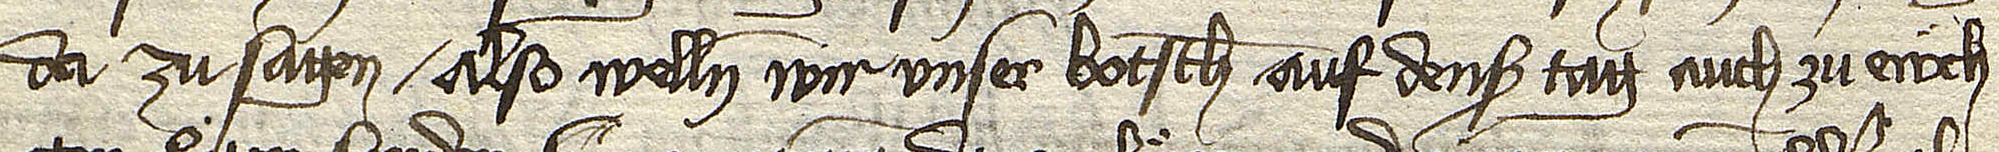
da ʒu ſagen / alſo welln* wir vnſer botſch* / auf denſ* tag auch ʒu eẅch
